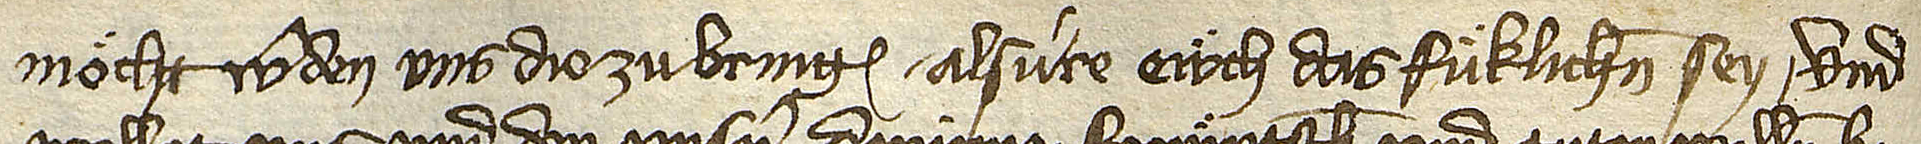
möcht w*den vns die ʒu bring* / alſu*re eẅch das füklichn* ſey / Vnd
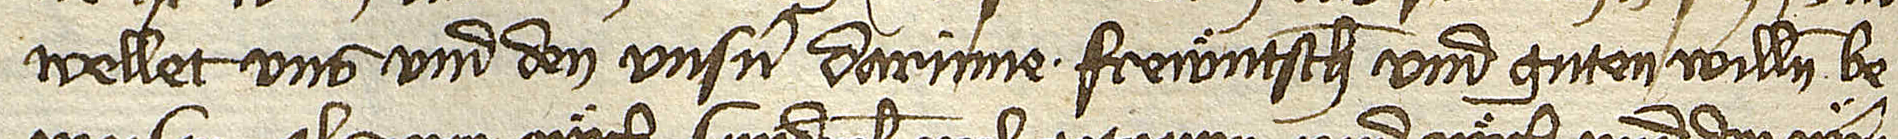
wellet vns vnd den vnſn* darinne . freẅntſch* vnd guten willn* be
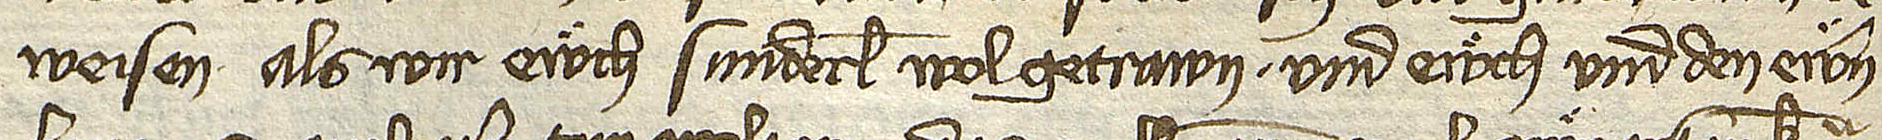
weiſen . als wir eẅch ſunderl* wol getrawen / vnd eẅch vnd den eẅ*n
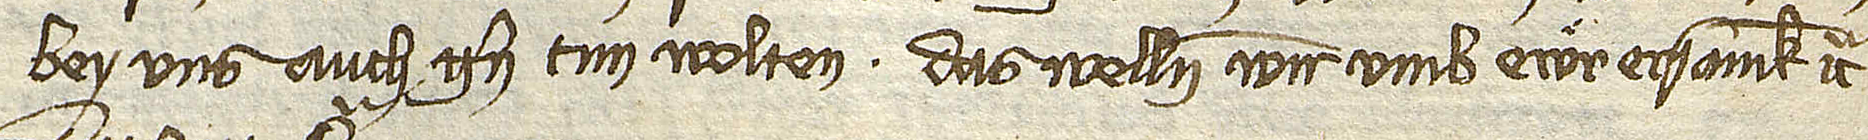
bey vns auch g*n tun wolten . das welln* wir vmb eẅr erſamk* ec*
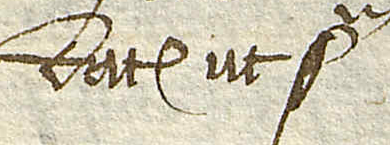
Dat* ut ſ*
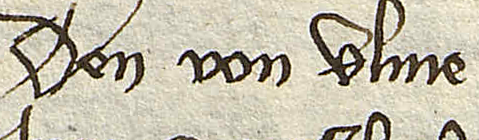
Den von Vlme
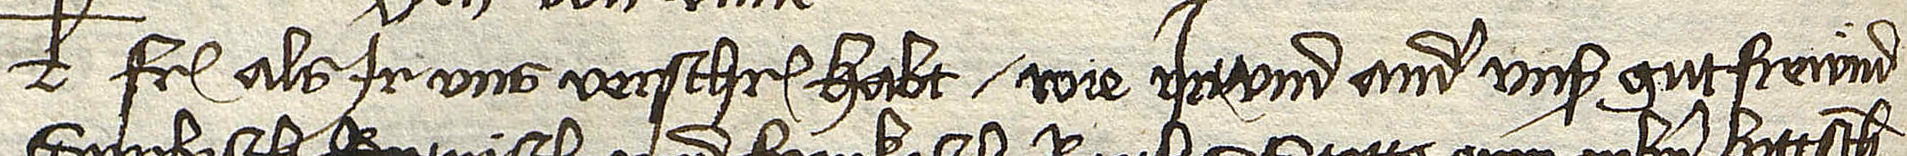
L* fr* als Ir vns verſchr* habt / wie Ir vnd and* vnſ* gut freẅnd
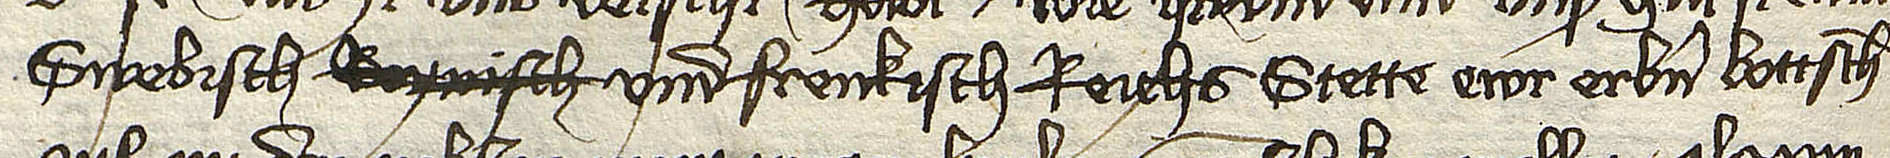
Swebiſch Reyniſch vnd frenkiſch Reichs Stette ewr erbn* bottſch*
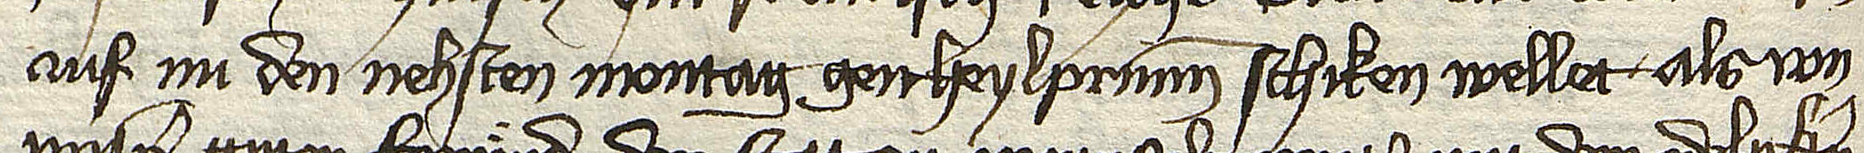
auf nu de nehſten montag gen heylprunn* ſchiken wellet / als von
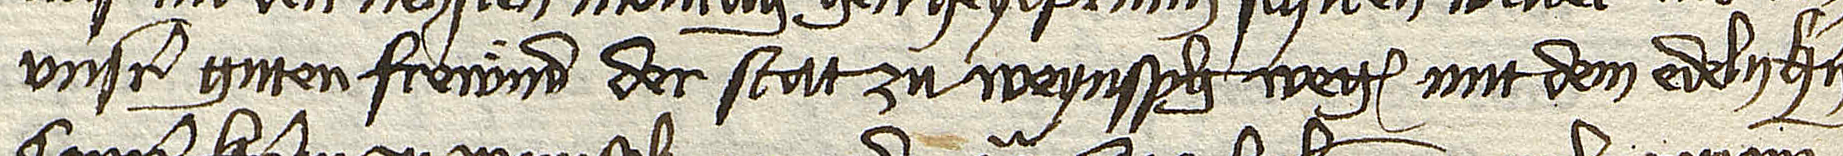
vnſr* guten freẅnd der ſtat ʒu weynſp*g weg* mit dem edeln H*n
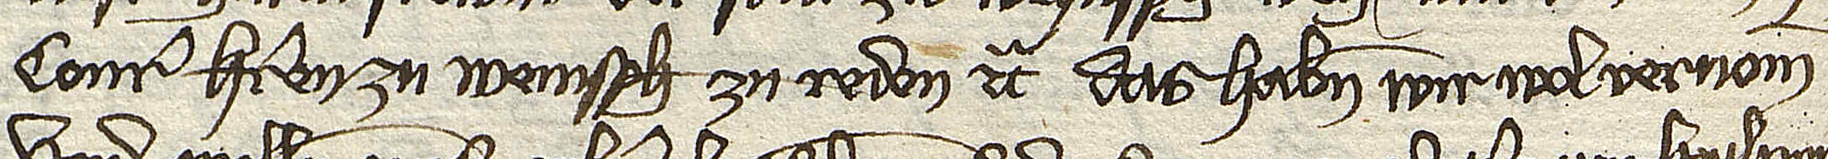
Conr* H*ren ʒu weinſp*g ʒu reden ec* das habn* wir wol vernom*
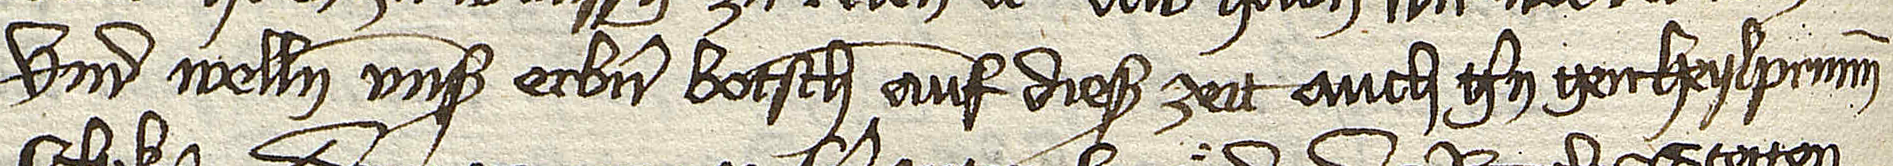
Vnd welln* vnſ* erbn* botſch* auf dieſ* ʒeit auch g*n gen heylprunn*
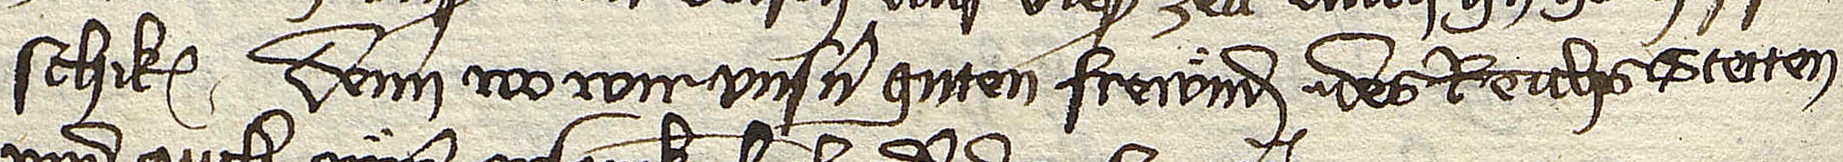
ſchik* / Denn wo wir vnſn* guten freẅnd* ~ des Reichs Stetten
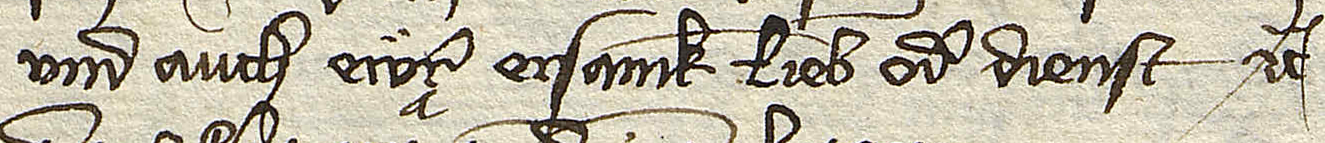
vnd auch eẅr* erſamk* lieb od* dienſt ec*
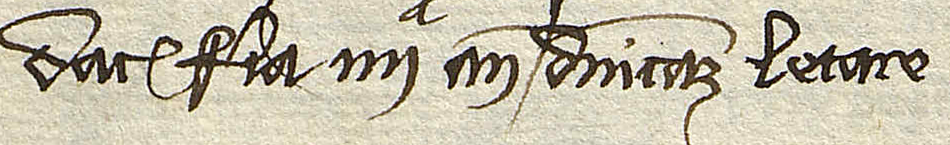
Dat* fi*a iiii* an* d*nica* letare
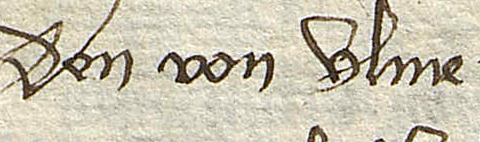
Den von Vlme
